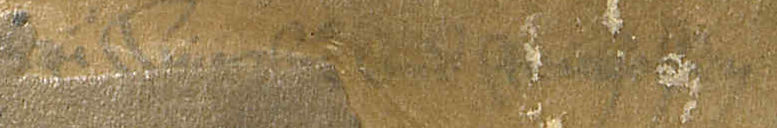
%% wi%%%% vnd %%%%%%%%
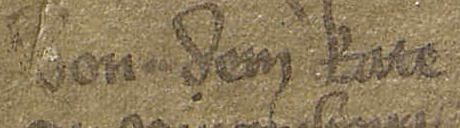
von ~ dem Rate
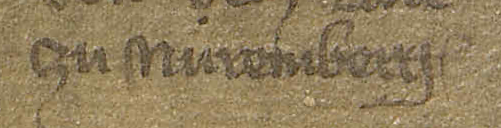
cʒu Nüremberg
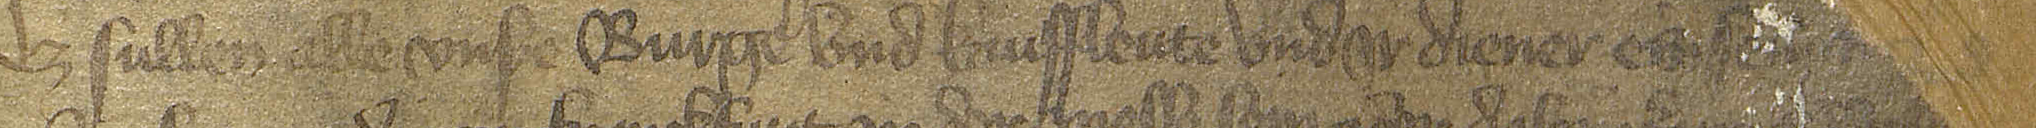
Eʒ ſüllen alle vnſ*e Burge* vnd kauffleute vnd Ir diener es ſein %%%%%
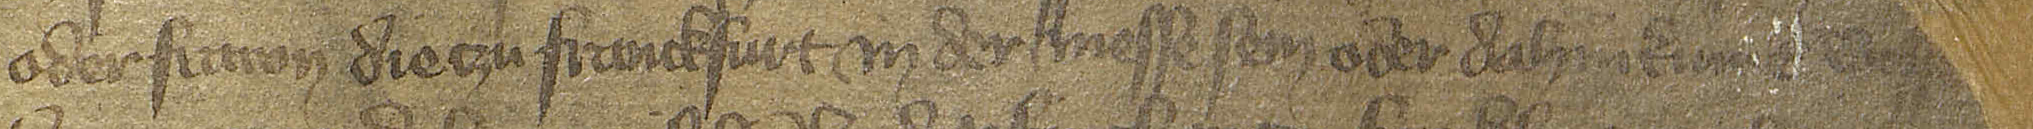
oder frawn die cʒu franckfurt in der meſſe ſein oder dahin kume* %%%%%%%
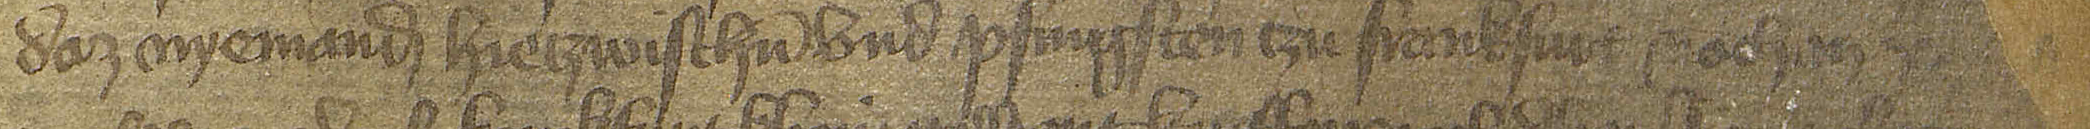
daʒ nyemand* hiecʒwiſchn* vnd pfingſten cʒu frankfurt %%chen %%%%%%
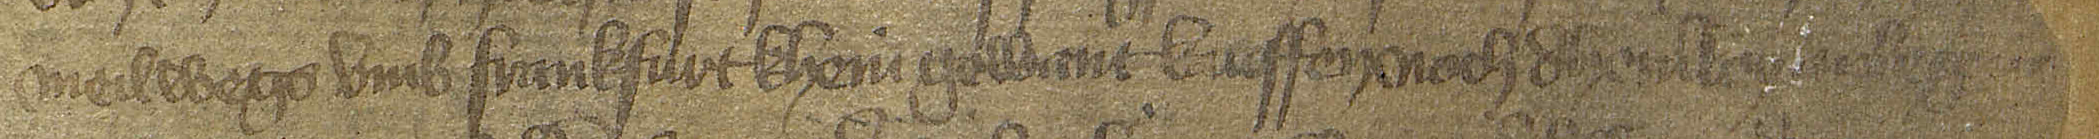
meilwegs vmb frankfurt khein gewant kauffen noch dhein*ley %%%%%%
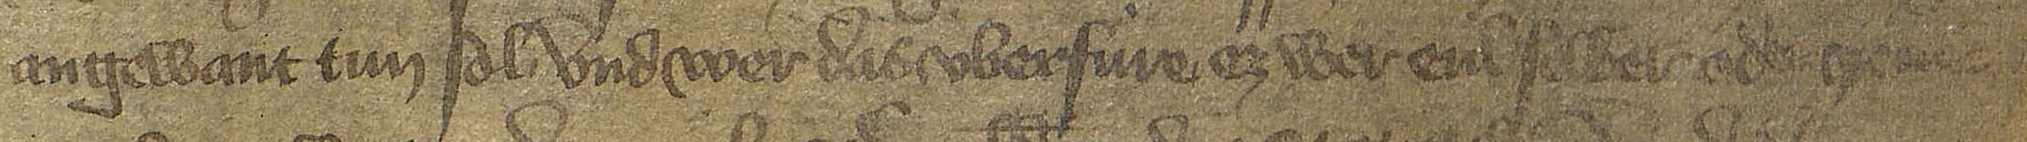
angewant tun ſol / Vnd wer das vberfüre eʒ wer ein* ſelber oder %%%%%
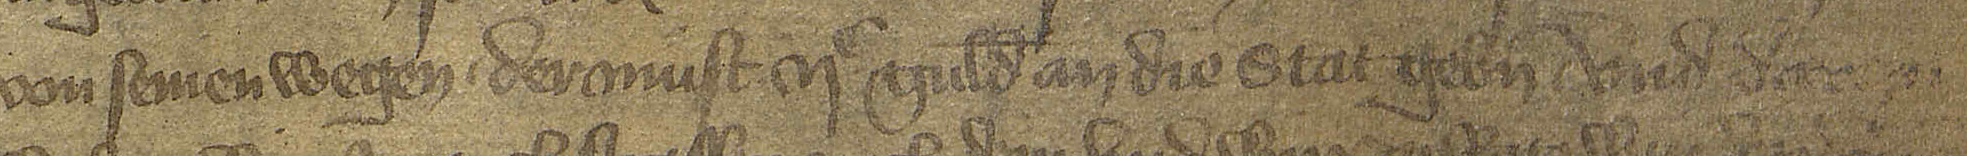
von ſeinen wegen / der müſt ii* guld* an die Stat gebn* / Vnd daran
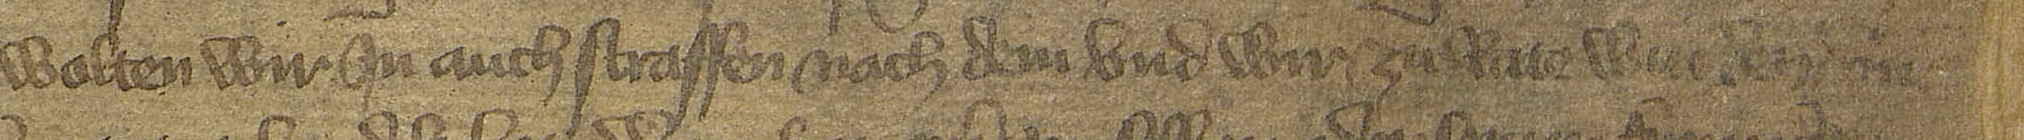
wolten wir In auch ſtraffen nach dem vnd wir cʒu Rate w%%%% %%%%
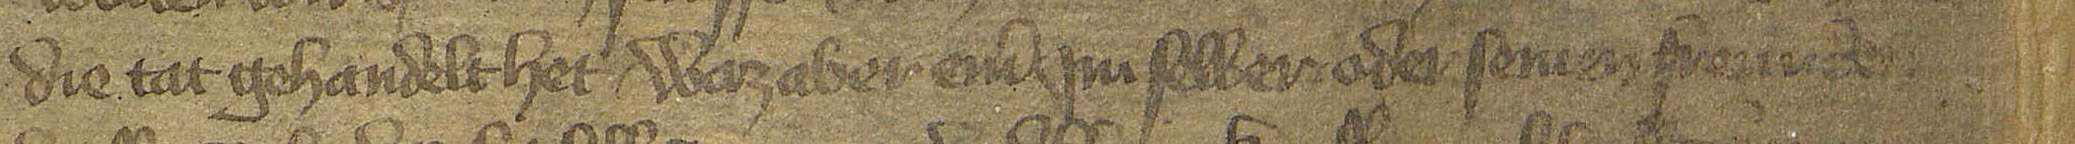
die tat gehandelt het / waʒ aber ein* Im ſelber oder ſeinen freunden
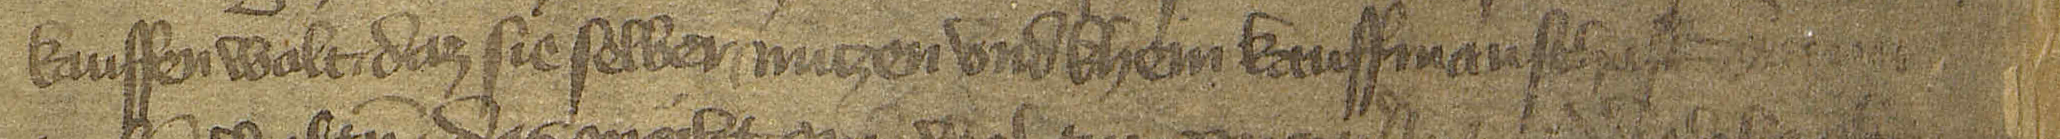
kauffen wolt / daʒ ſie ſelber nucʒen vnd khein kauffmanſchaft %%%%%%%
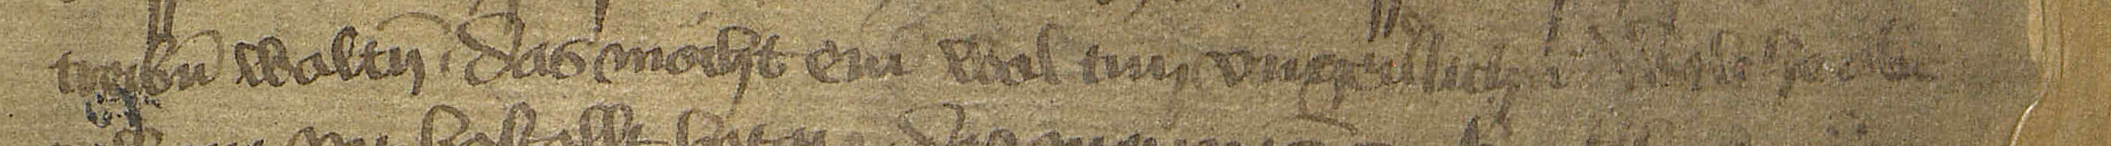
treibn* woltn* / das möcht ein* wol tun vngeu*lichn* %%%%%%%%%%
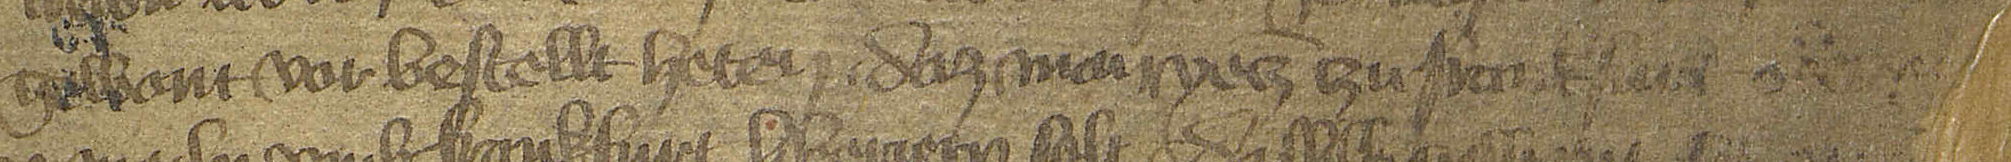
gewont vor beſtellt heten / daʒ man yecʒ* cʒu frankfurt %%%%%
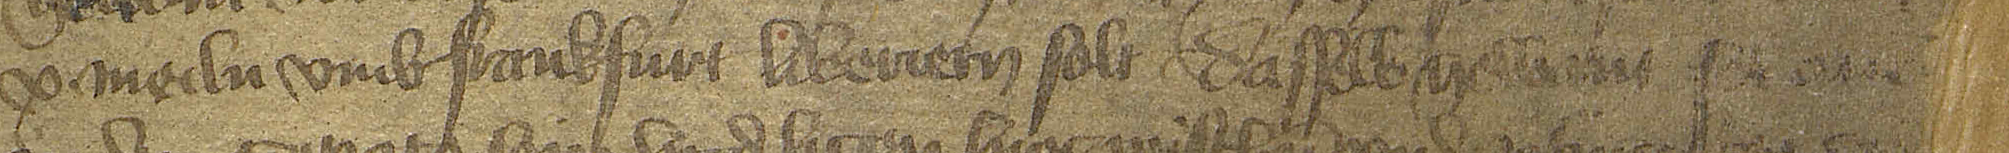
x . meiln vmb frankfurt liberiern ſolt / Daſſelb gewant %%%%%
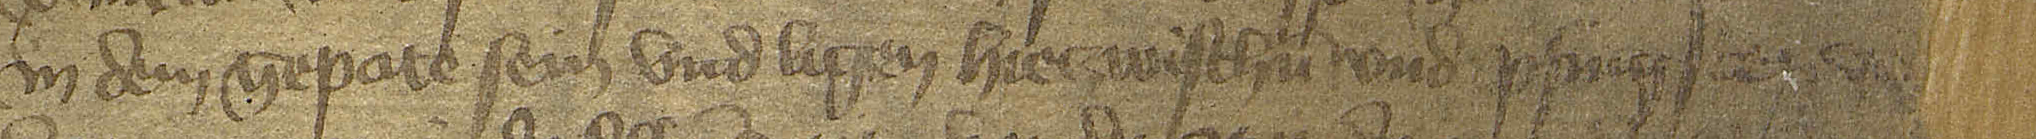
in dem gepote ſein vnd ligen hiecʒwiſchn* vnd pfingſten %%%%%%
